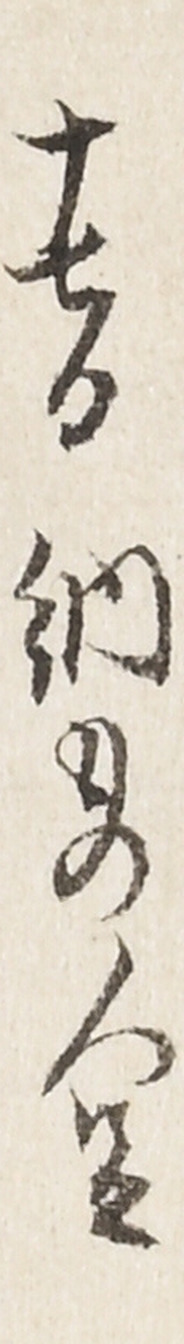十七日納もの人足
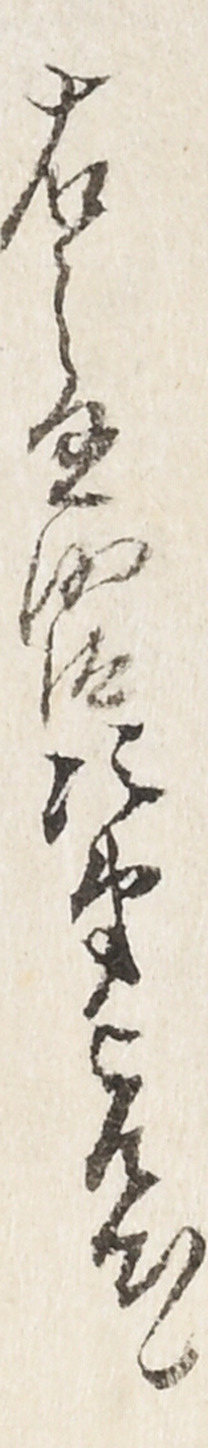右之通納酒次第被差出候
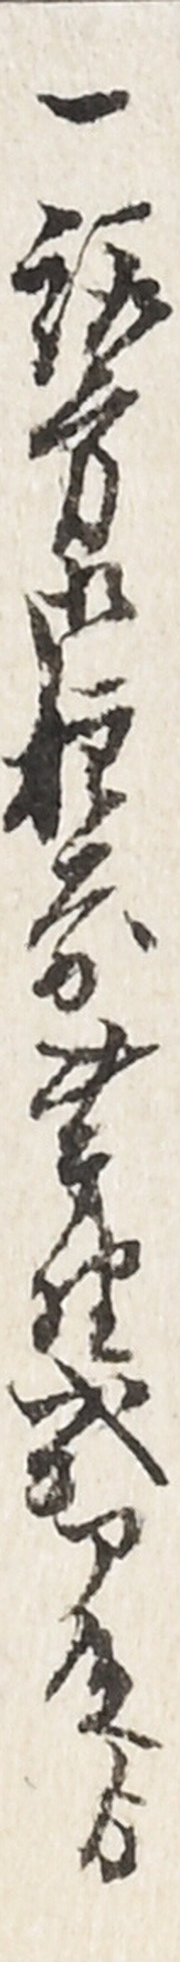一諏方御柱前茅野式部殿より
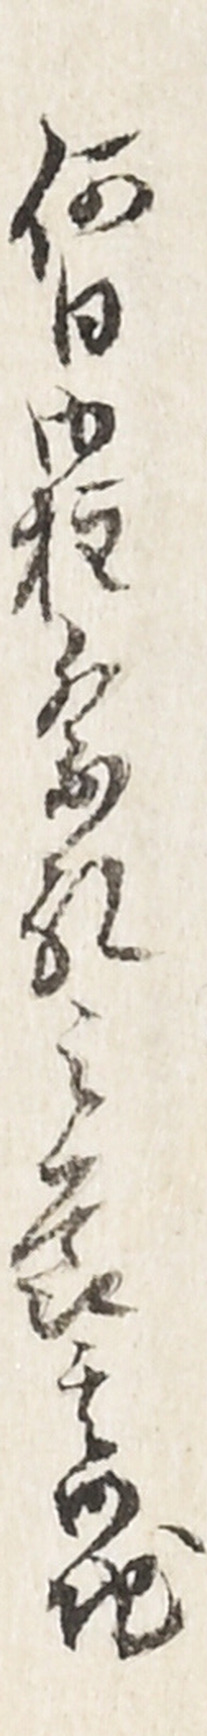何日御柱祭礼之節其御地
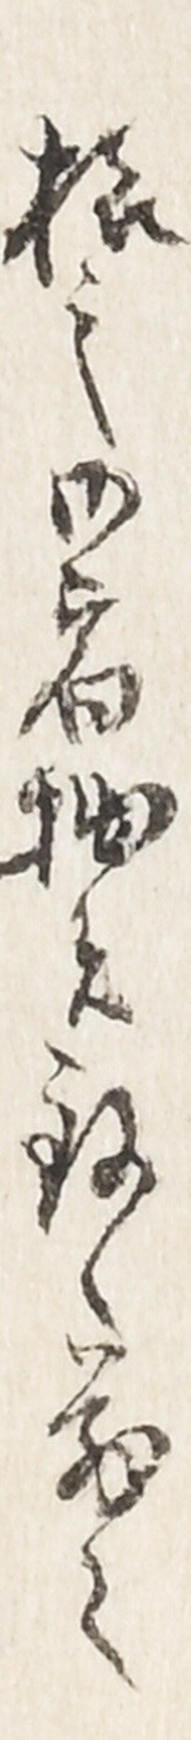様之御宿拙者致候前々
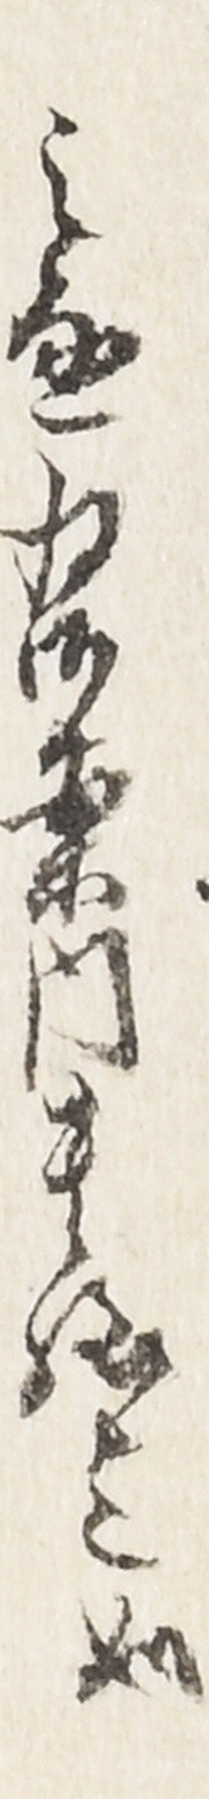之通為御案内貴様迄如
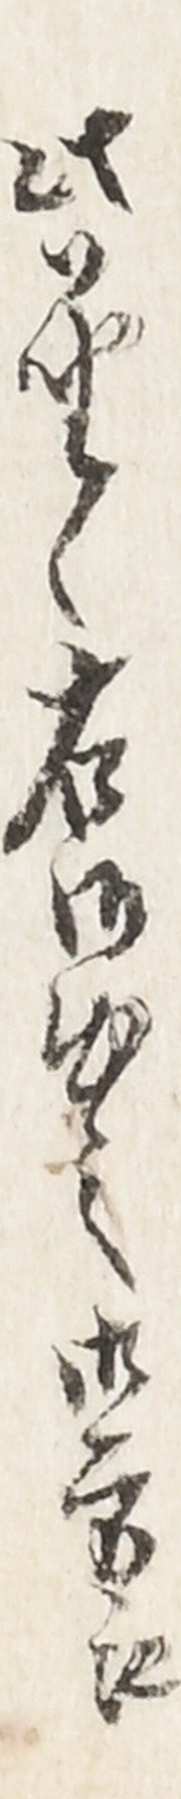此御座候右御出之御方被
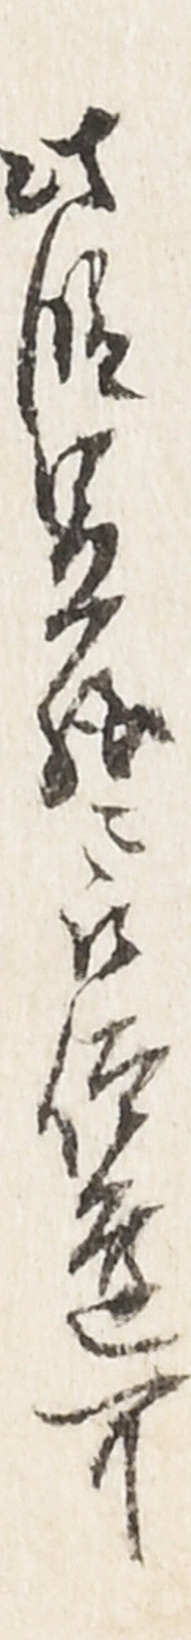此段宜様ニ被仰遣可
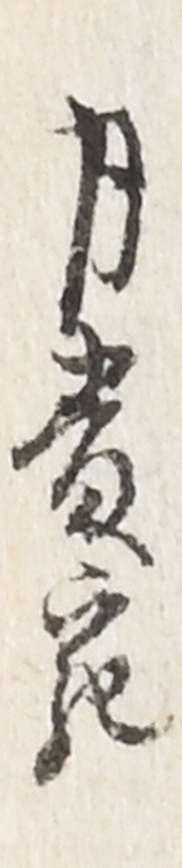月番宛

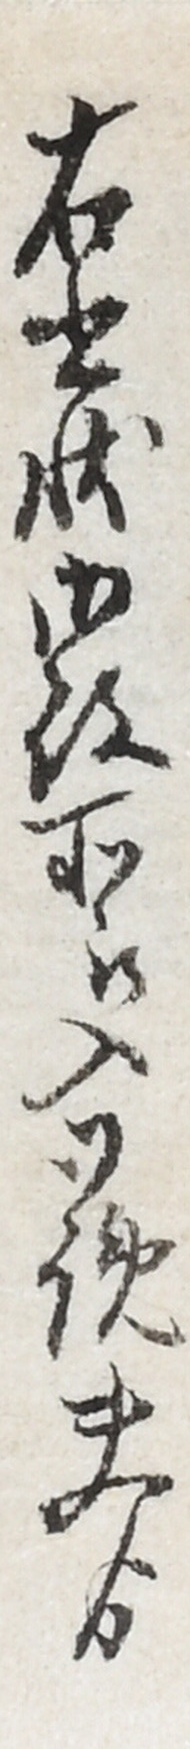右書状御役所江入御覧夫より
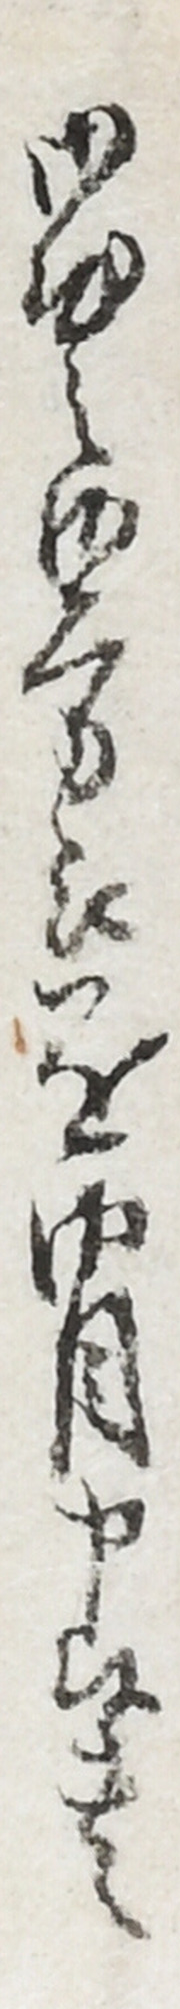御幼之御方被懸御目申候者
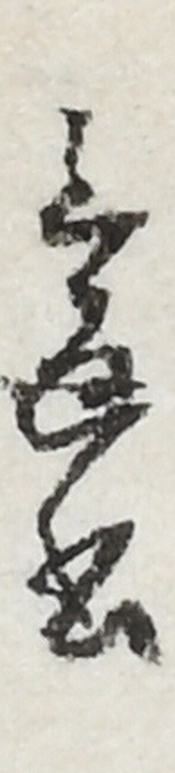上返書
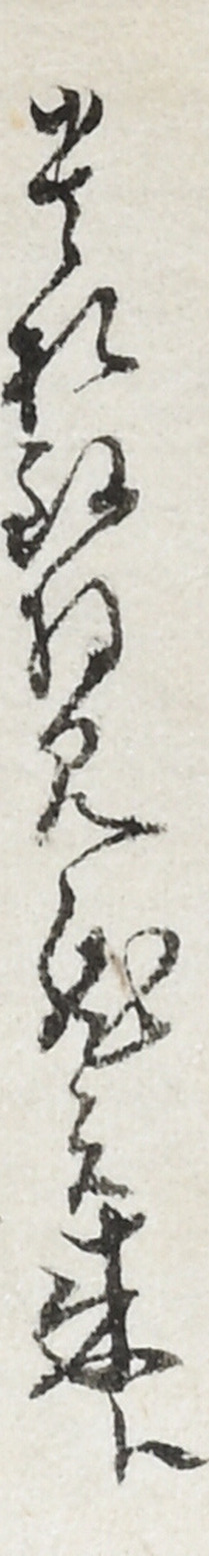貴札致拝見就は来ル
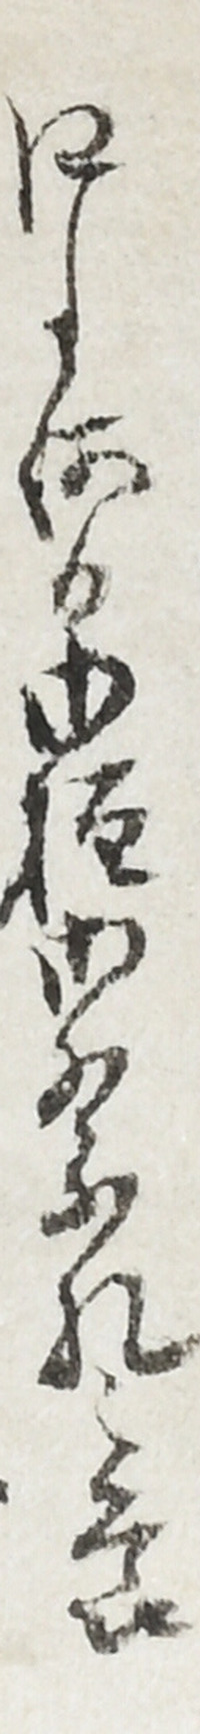四月何日御柱御祭礼之節
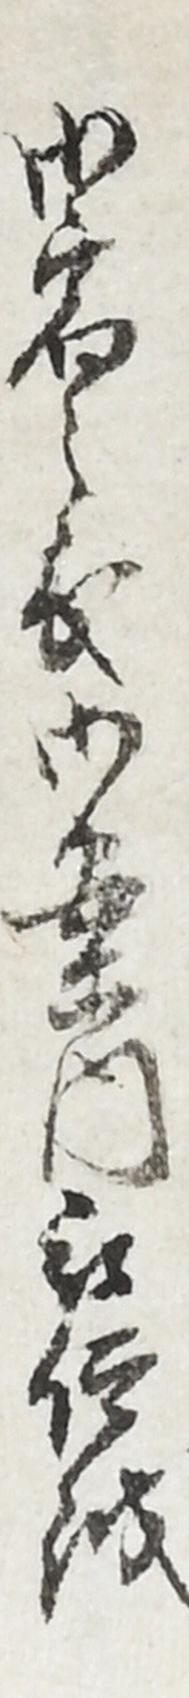御宿之義御案内被仰越
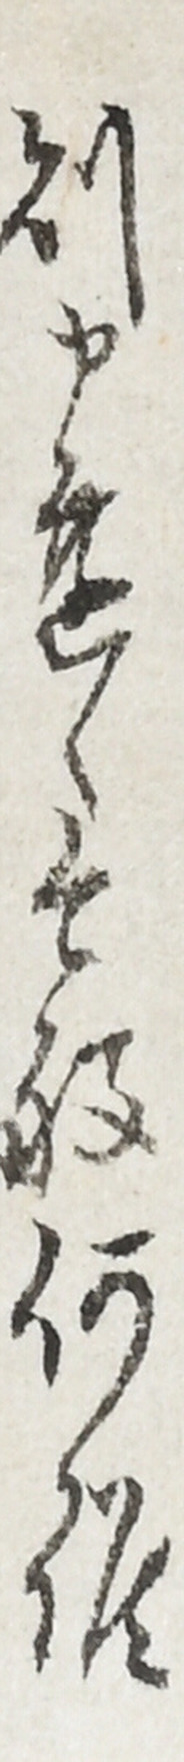則申達候今般何候
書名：年内行事懐中録
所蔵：伊那市立高遠町図書館・合同会社AMANE
